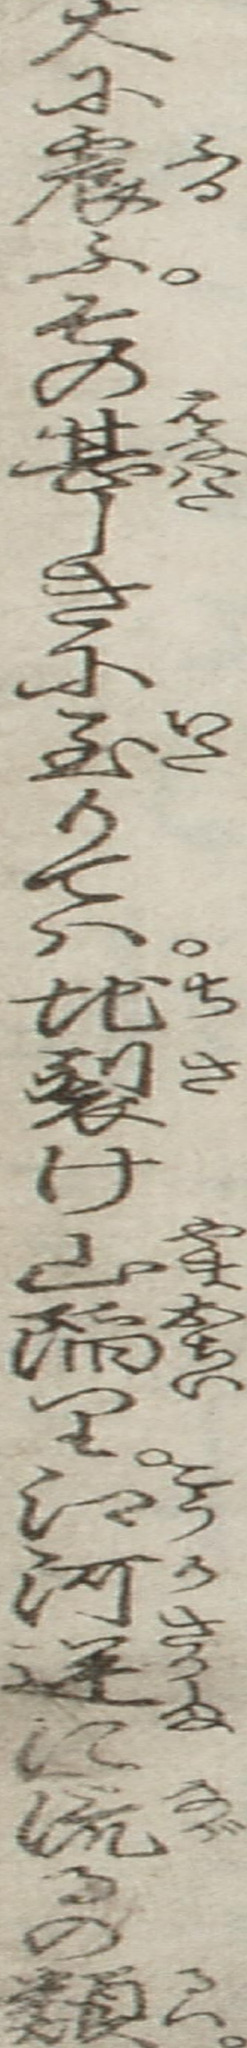大に震ふ。その甚しきに至りては。地裂け山陥り。江河逆に流るの類。

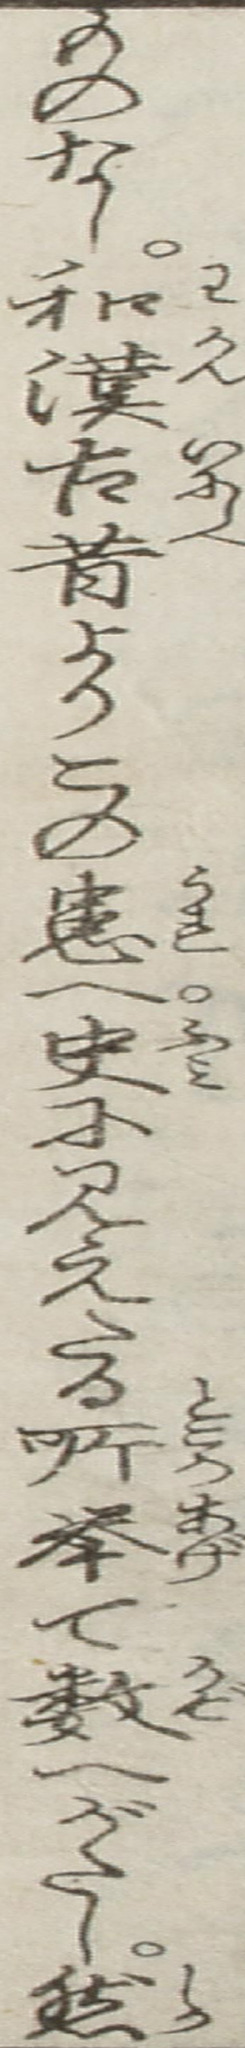ものなし。和漢古昔よりこの患へ。史に見えたる所挙て数へがたし。然
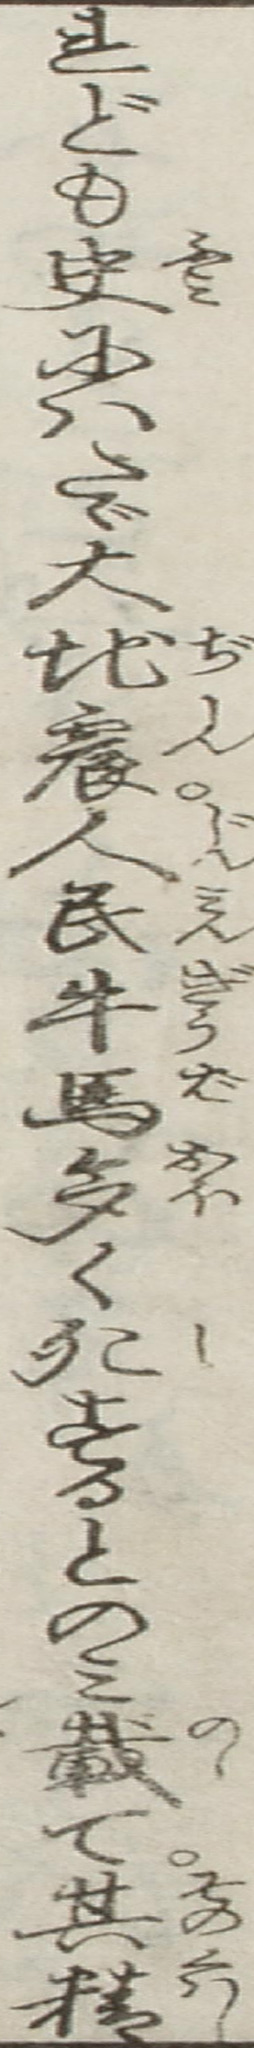れども史にはたゞ大地震。人民牛馬多く死することのみ載て。其精
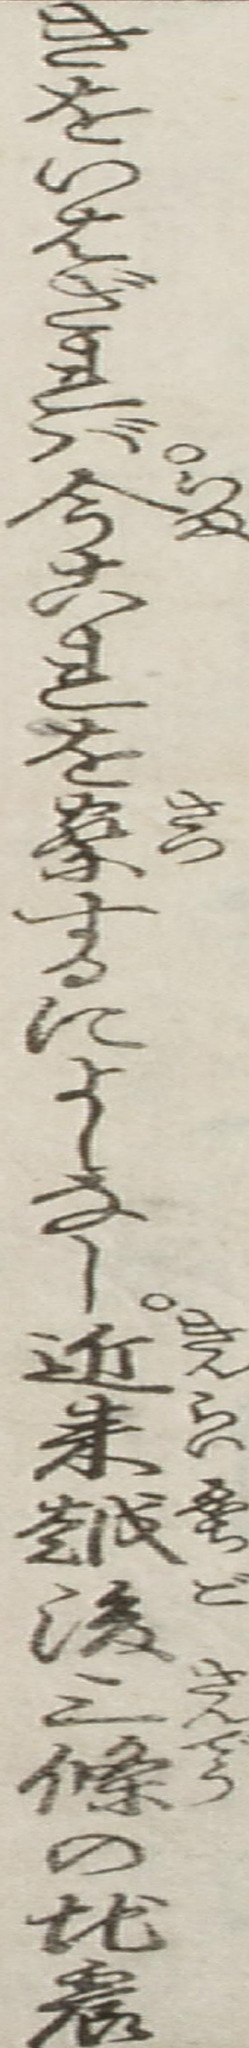きをいはざれば。今これを察するによしなし。近来越後三條の地震
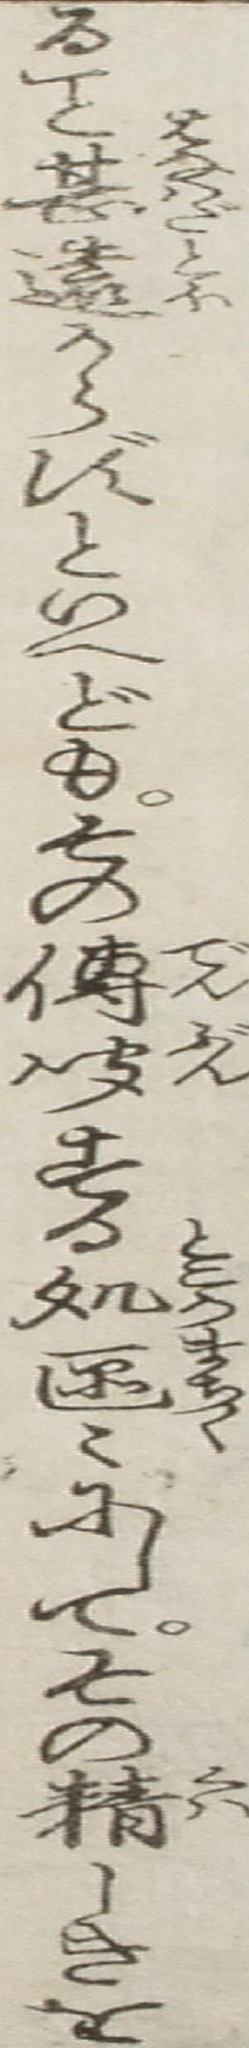ること甚遠からずといへども。その伝聞する処区々にして。その精しきを
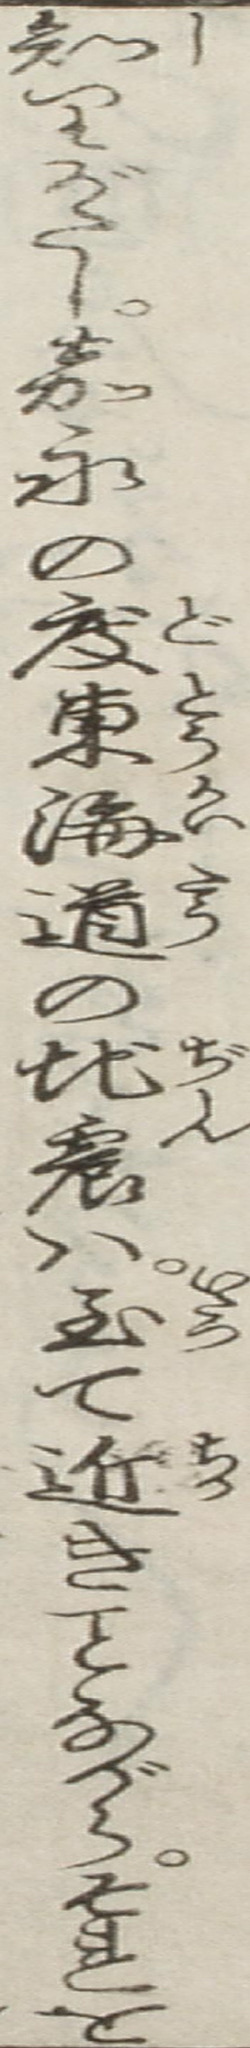知りがたし。嘉永の度東海道の地震は。至て近きことながら。それを
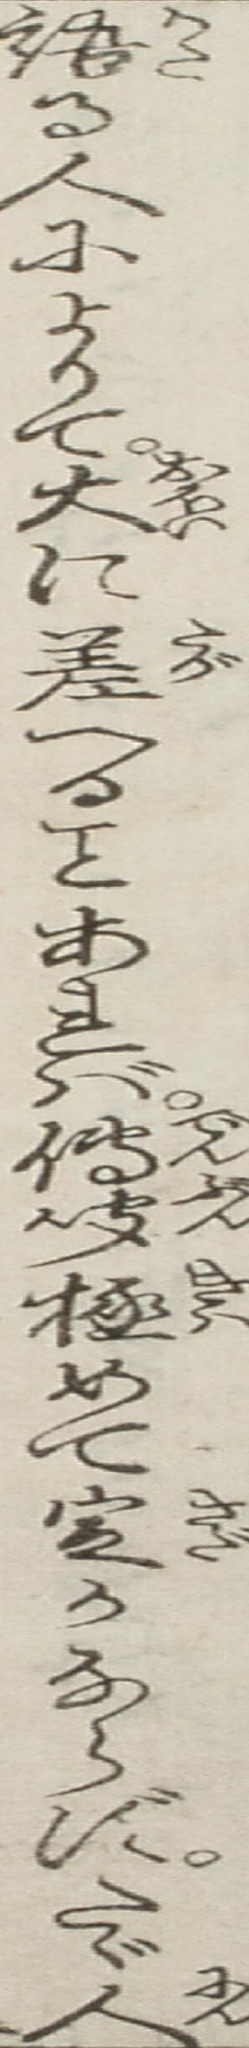語る人によりて。大に差へることあれば。伝聞極めて定かならず。たゞ人
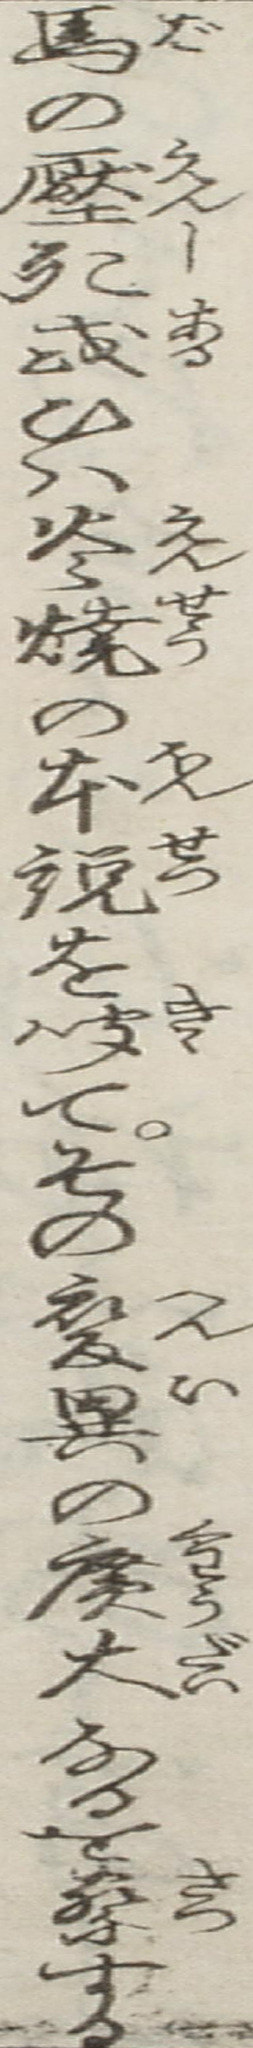馬の圧死或ひは炎焼の本設を聞て。その変異の広大なるを察する
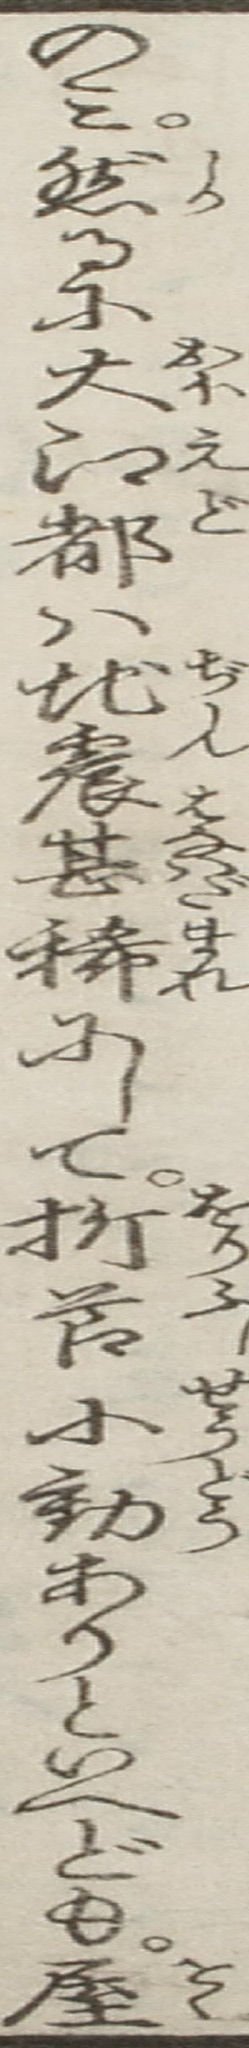のみ。然るに大江戸は地震甚稀にして。折節小動ありといへども。屋
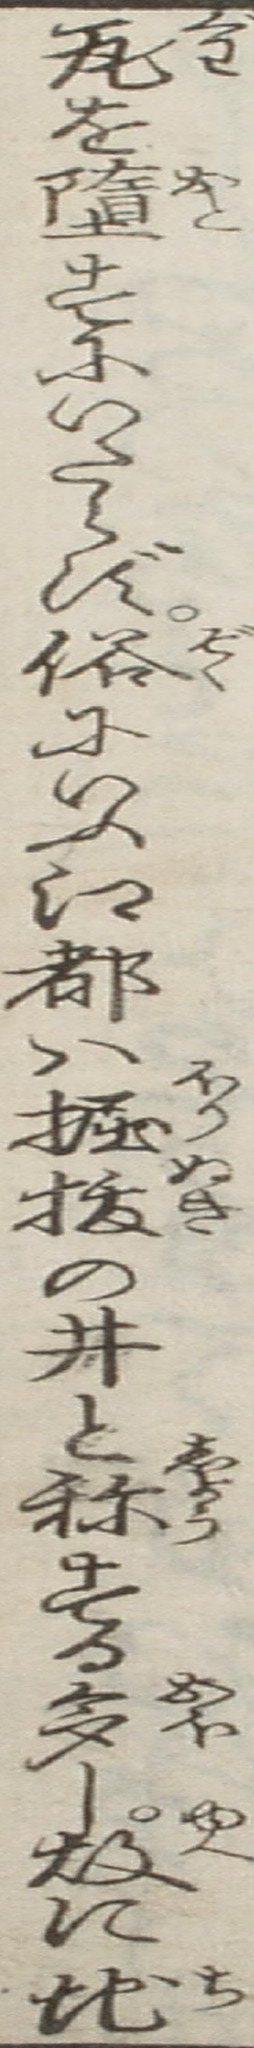瓦を堕すにいたらず。俗にいふ江都は掘抜の井と称する多し。故に地
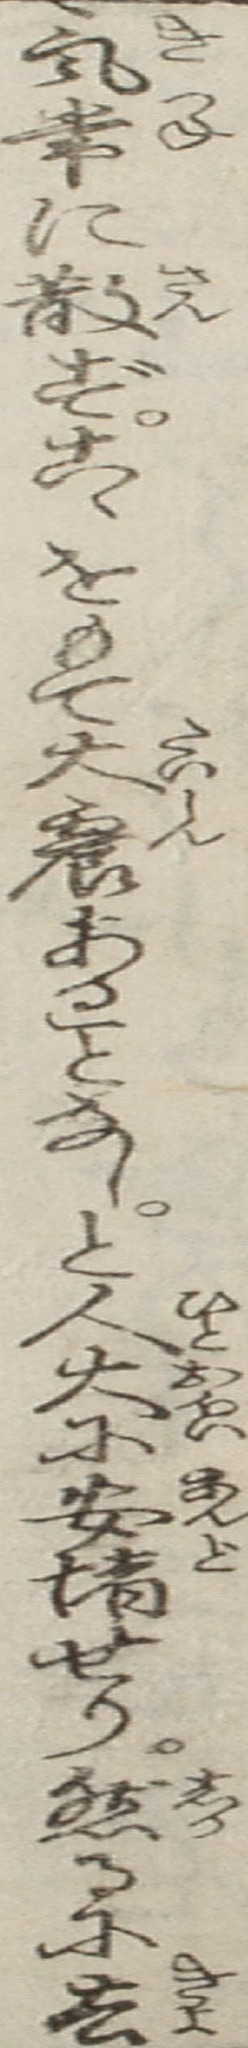気常に散ず。こゝをもて大震あることなし。と人大に安堵せり。然るに去
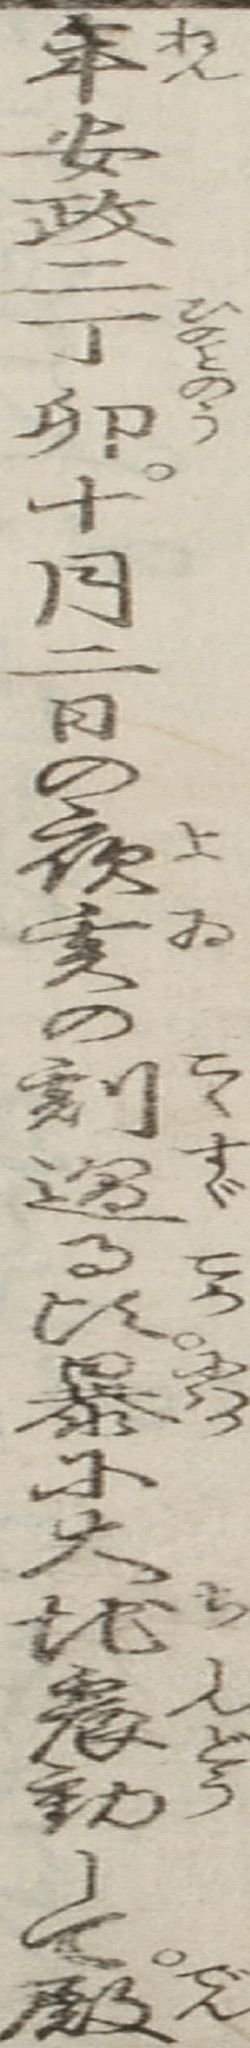年安政ニ丁卯。十月二日の夜亥の刻過る頃。暴に大地震動して。殿
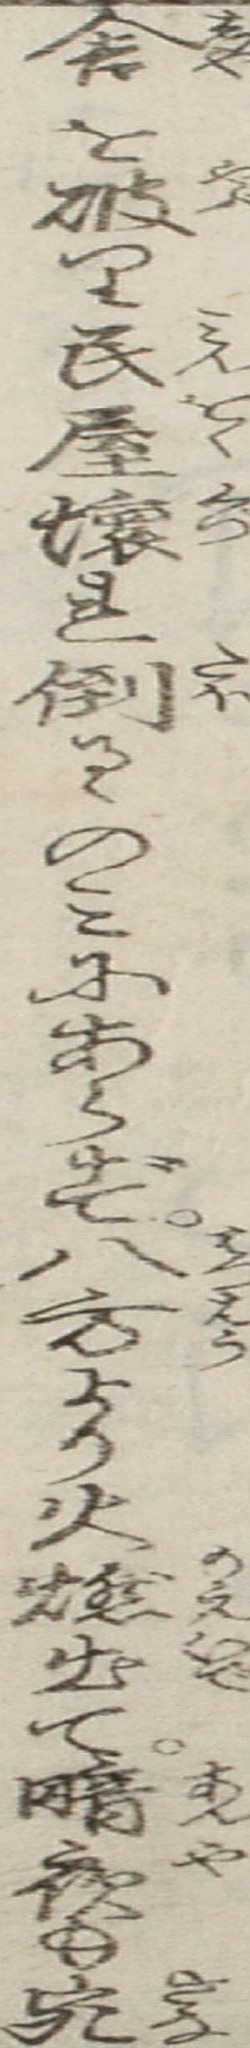舎を破り民屋壊れ倒るゝのみにあらず。八方より燃出て。暗夜も宛
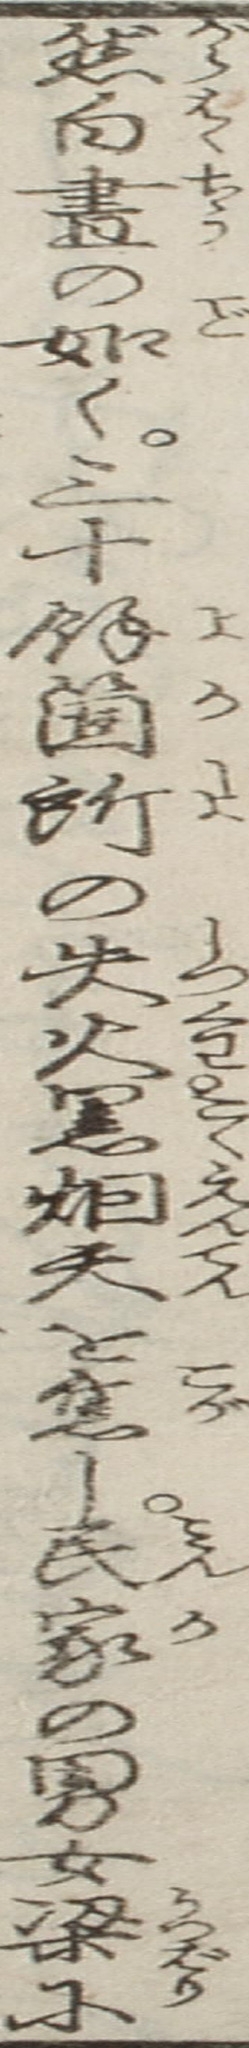然白昼の如く。三十餘箇所の失火。黒烟天を焦し。民家の男女梁に
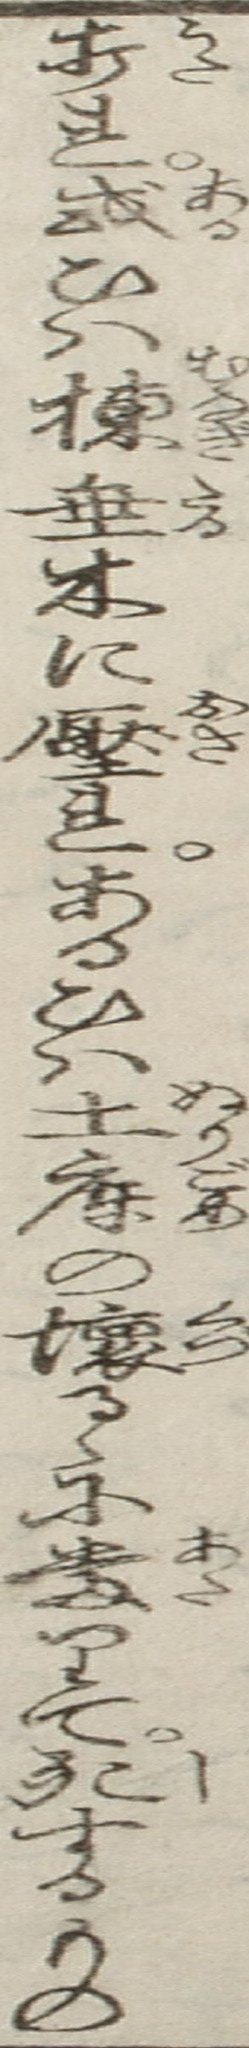打れ。或ひは棟垂木に圧れ。あるひは土庫の壊るゝに当りて。死するもの
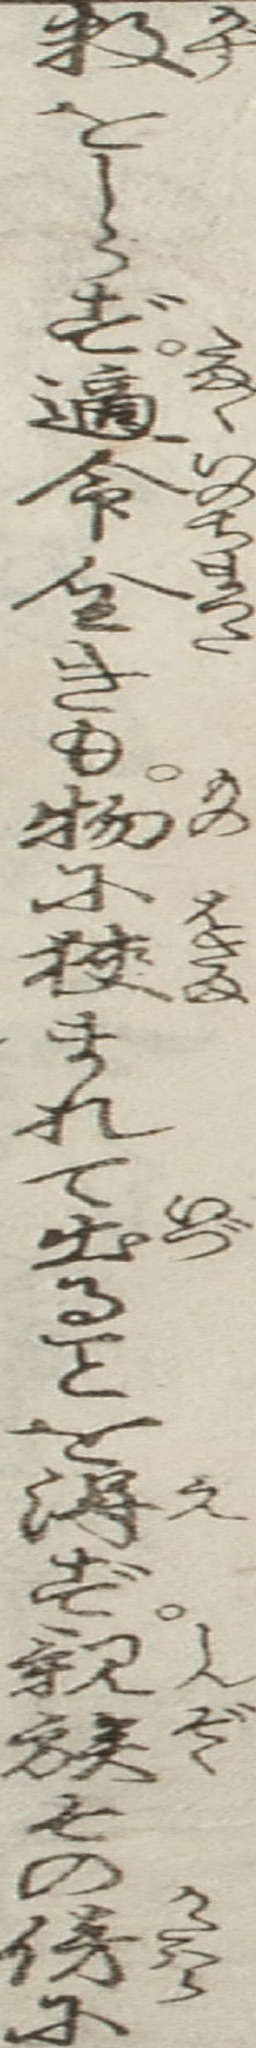数をしらず。適命全きも。物に挟まれて出ることを得ず。親族その傍に
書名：安政見聞録　上
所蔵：東京大学地震研究所図書室 Earthquake Research Institute Library, The University of Tokyo, JAPAN
